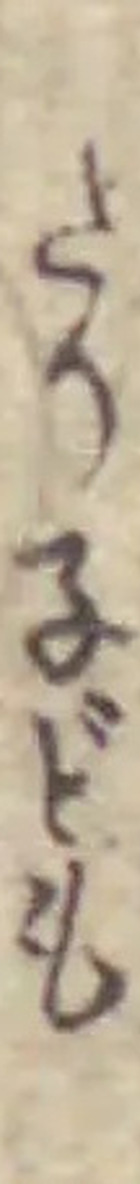たり子ども
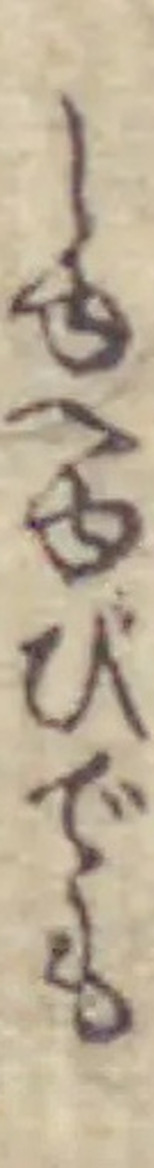しゆへゆびでも
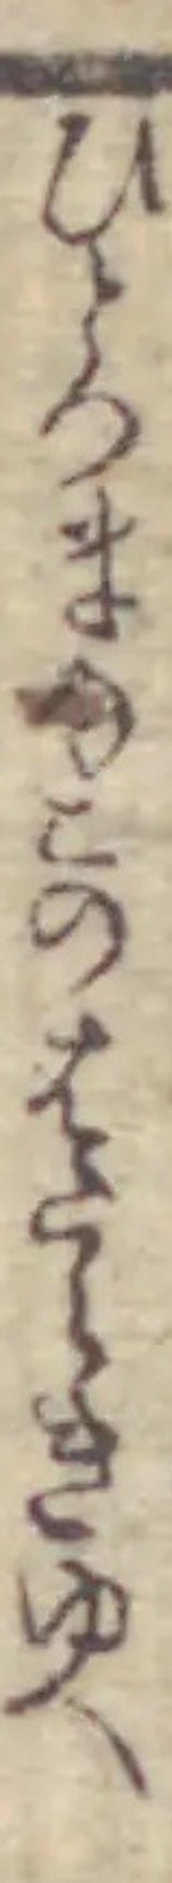ひとつまなこのはたらきゆへ
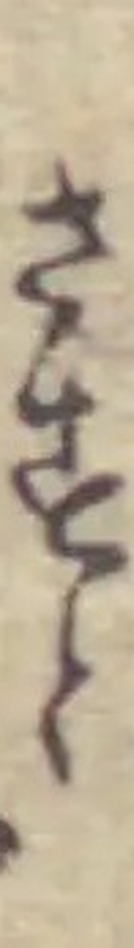さすと
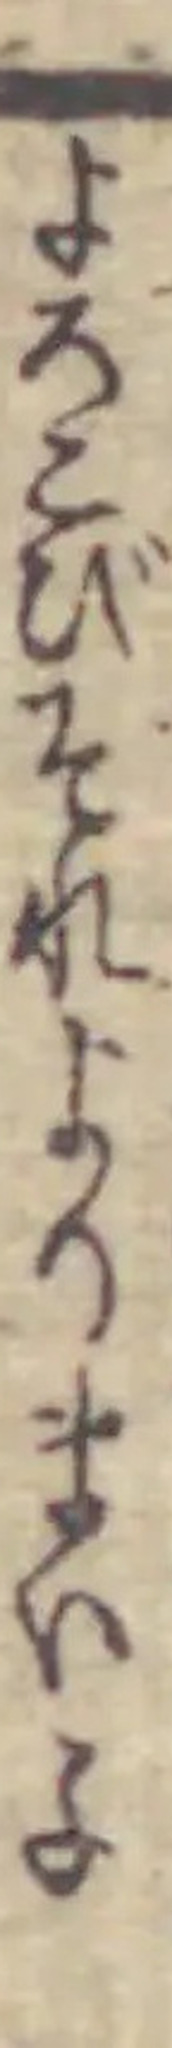よろこびそれよりまいよ
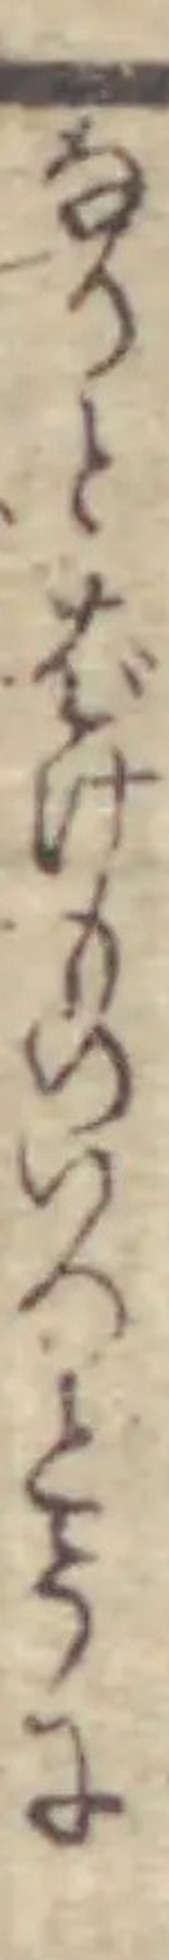なりとばけものゝいつとうに
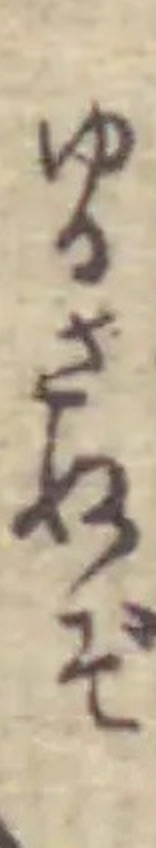ゆるさぬぞ
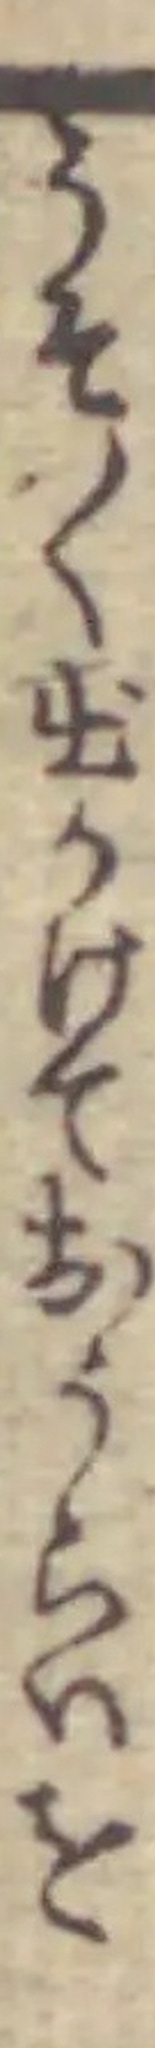うそ〳〵出かけておうらいを
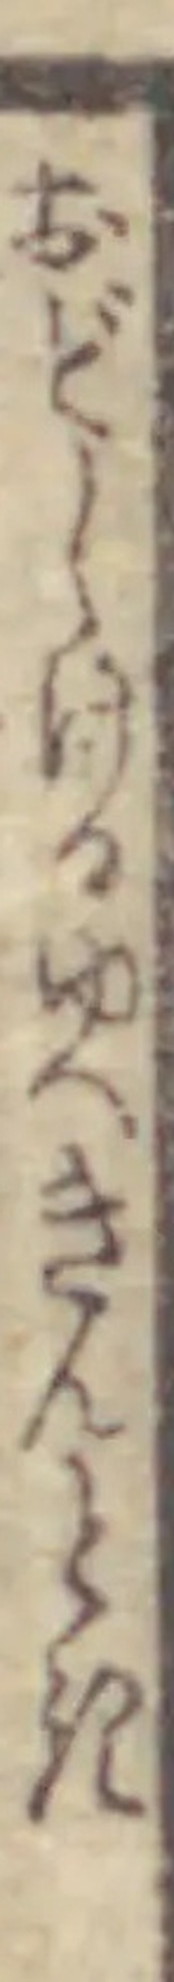おどしけるゆへきんとき
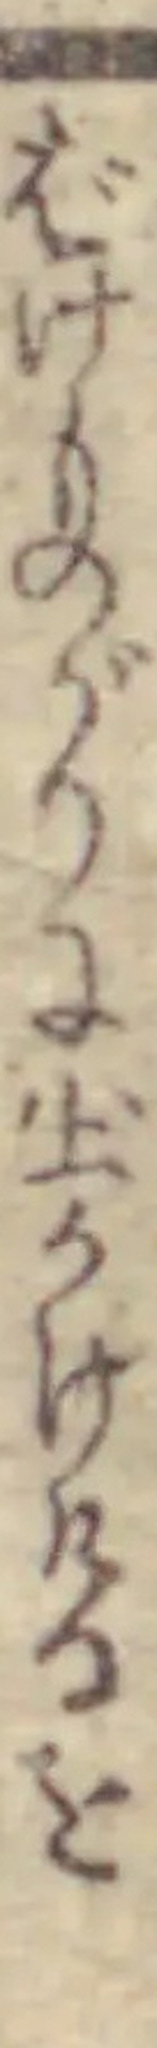ばけものがりに出かけけるを
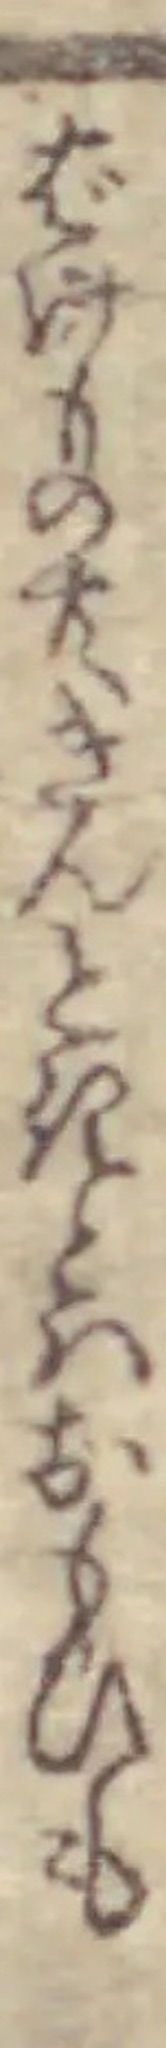ばけもの共きんときとはおもひも
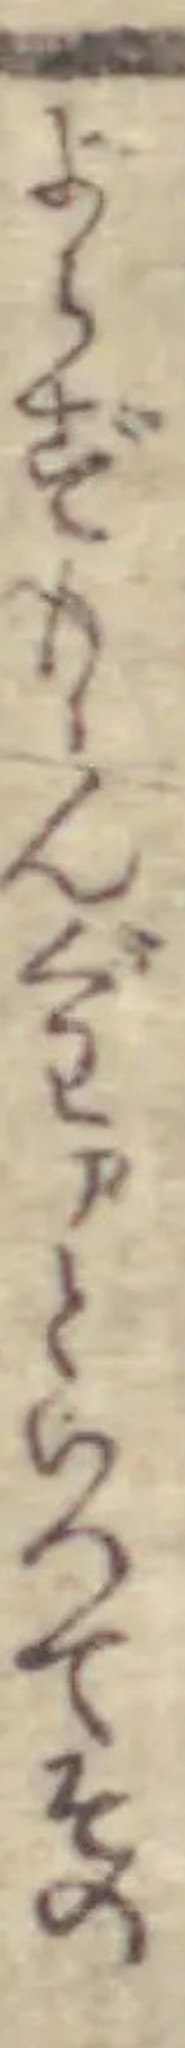よらずもゝんぐわァといつてその
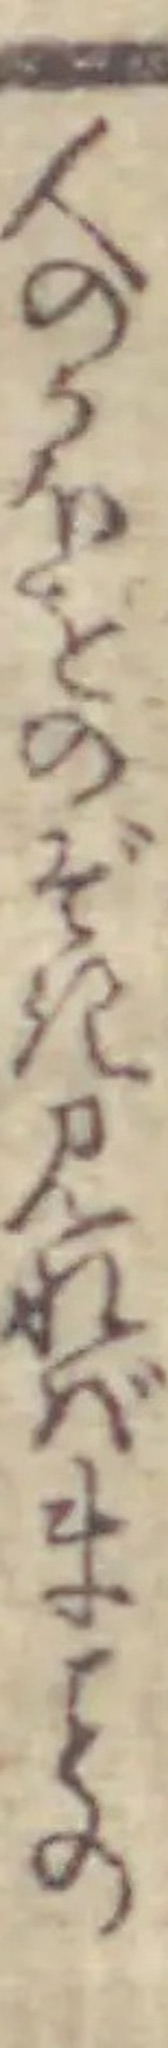人のかほをのぞき見ればまことの
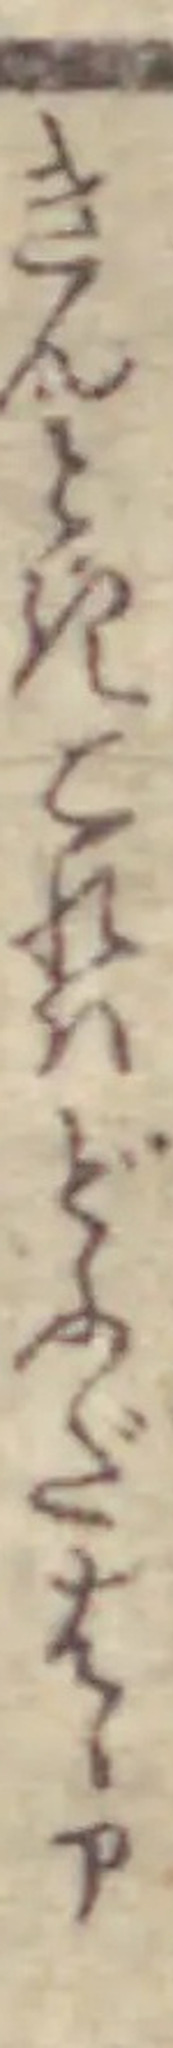きんときこれはどふだはゝァ
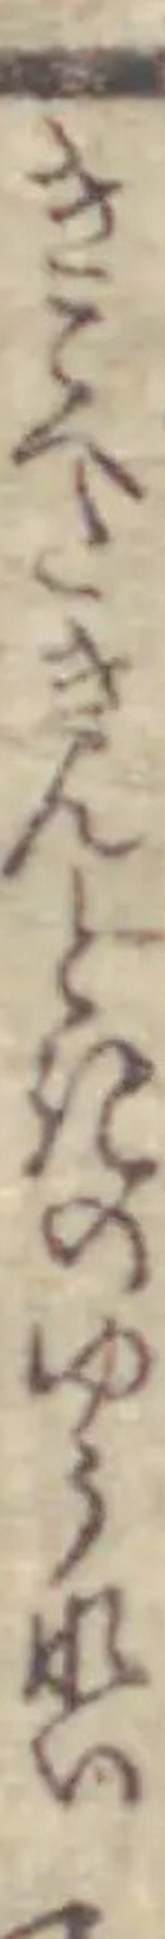きこへたきんときのゆうれい
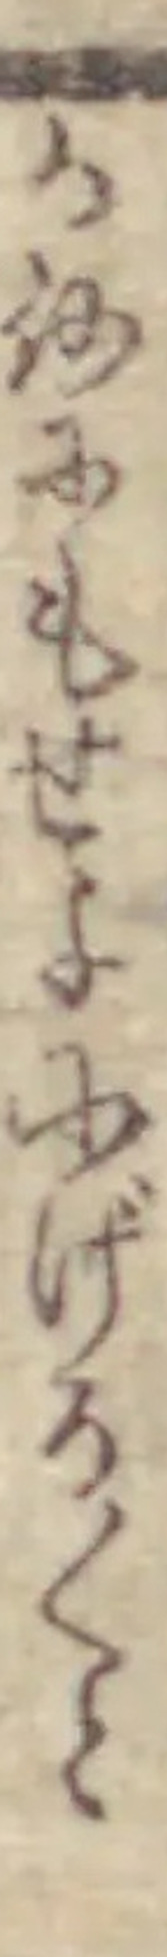か何にもせよにげろ〳〵と
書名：化物敵討 2巻
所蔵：国立国会図書館 National Diet Library, JAPAN
